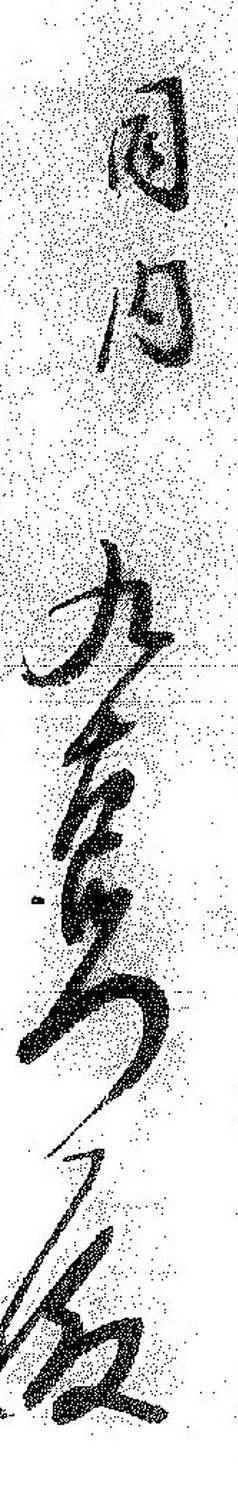同内九左衛門殿
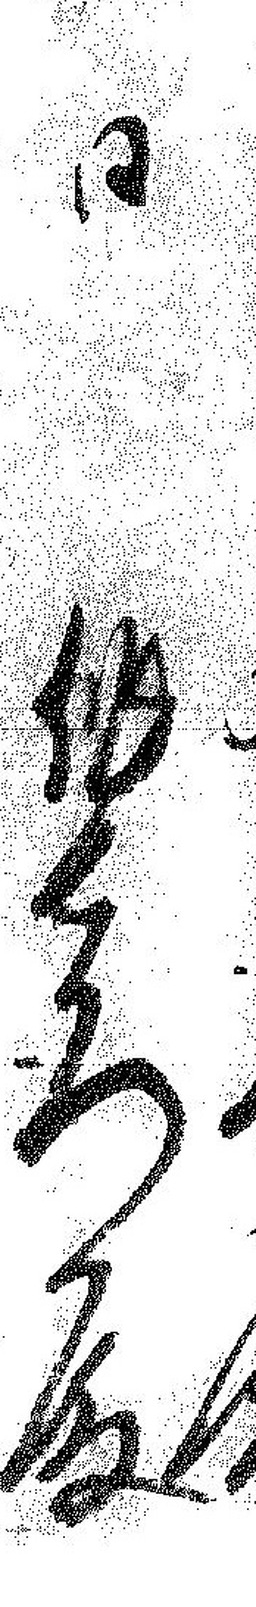同作右衛門殿
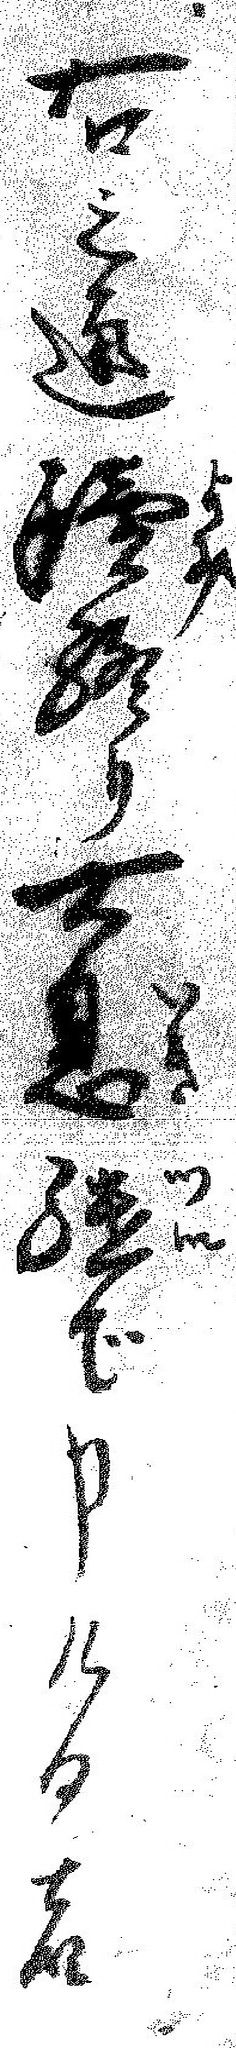右之通読終り大息継で申けるは
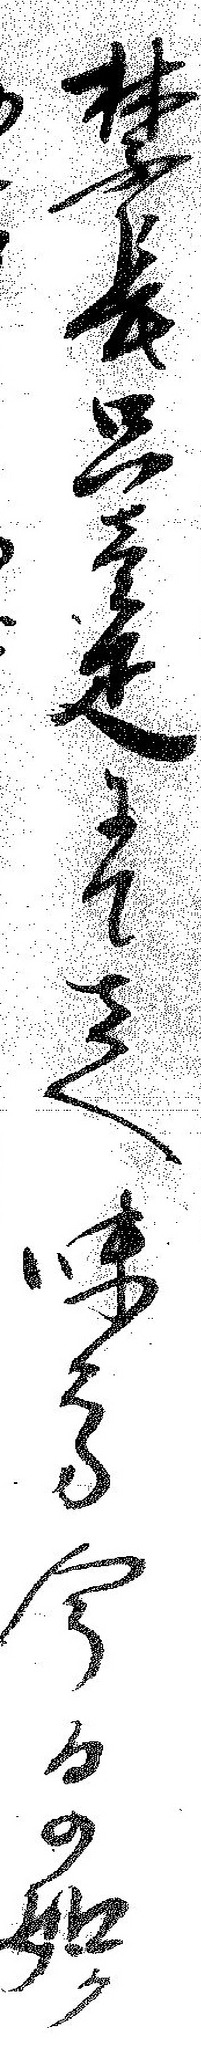禁長只壱疋にてさへ味方今日の如く
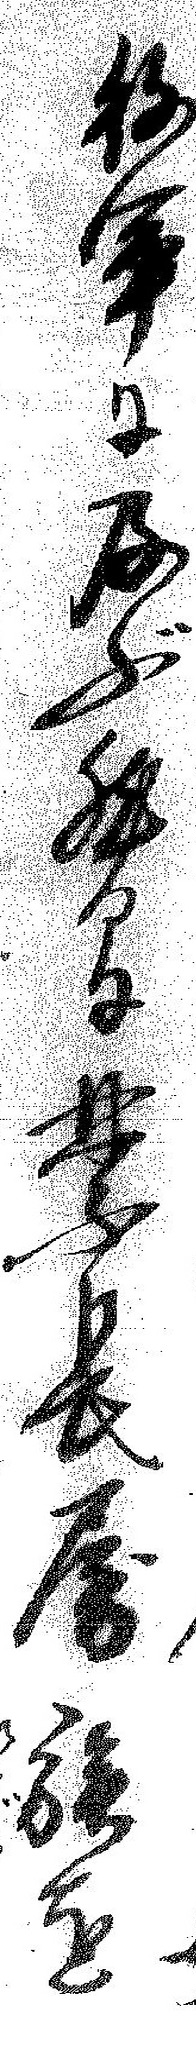敗軍に及ぶ然るに禁長属族を
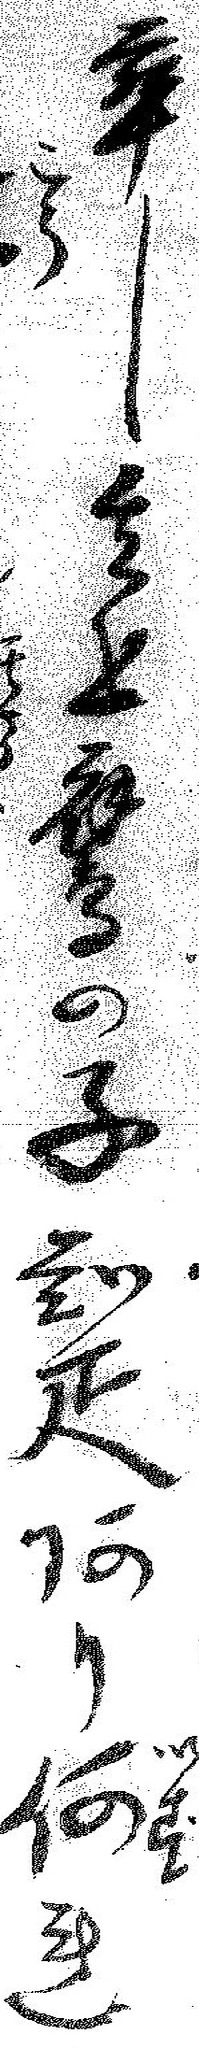率し其上鷹の子弐疋あり何れ
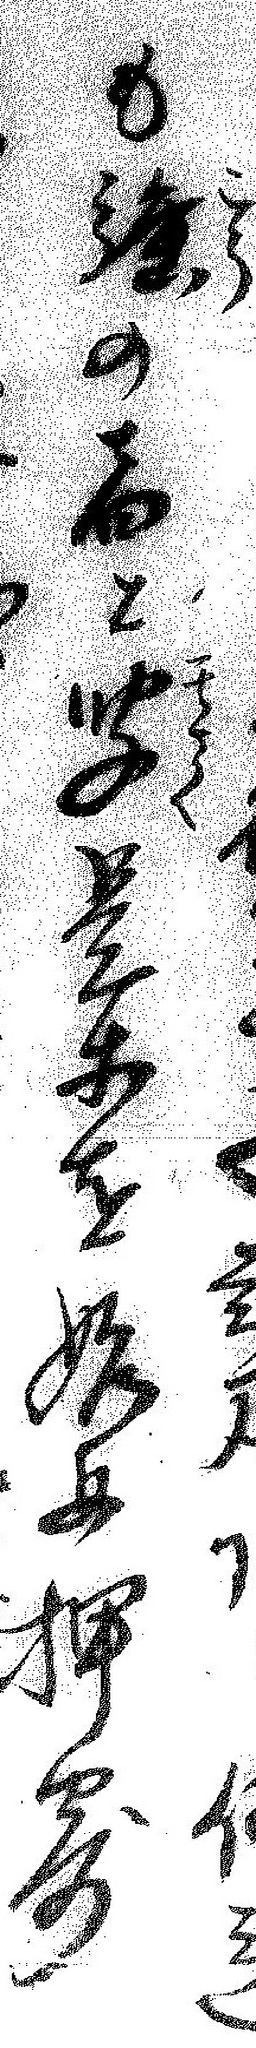も強の者と聞是等を始め押寄
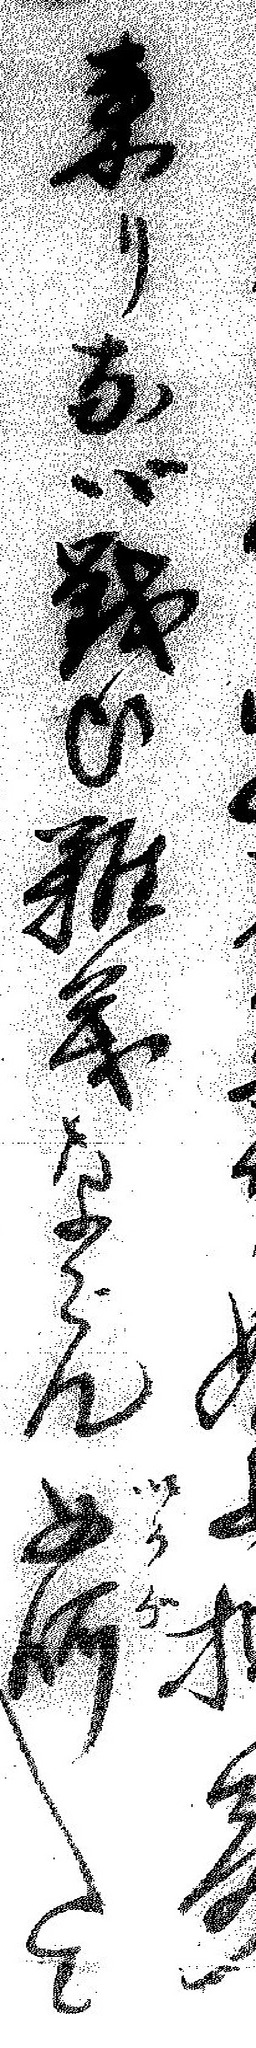来りなば戦ひ難義ならん如何して
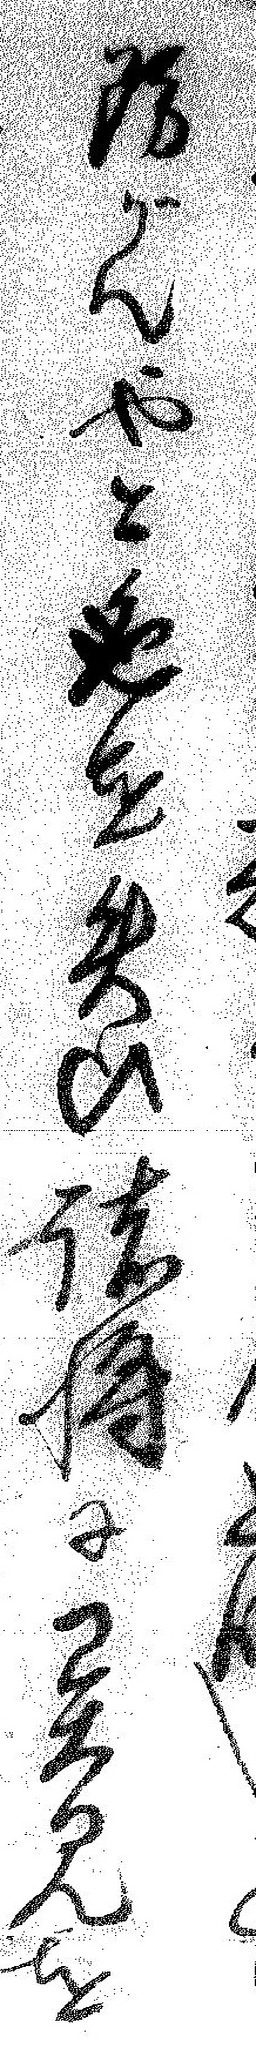防がんやと色を失ひ諸将に異見を
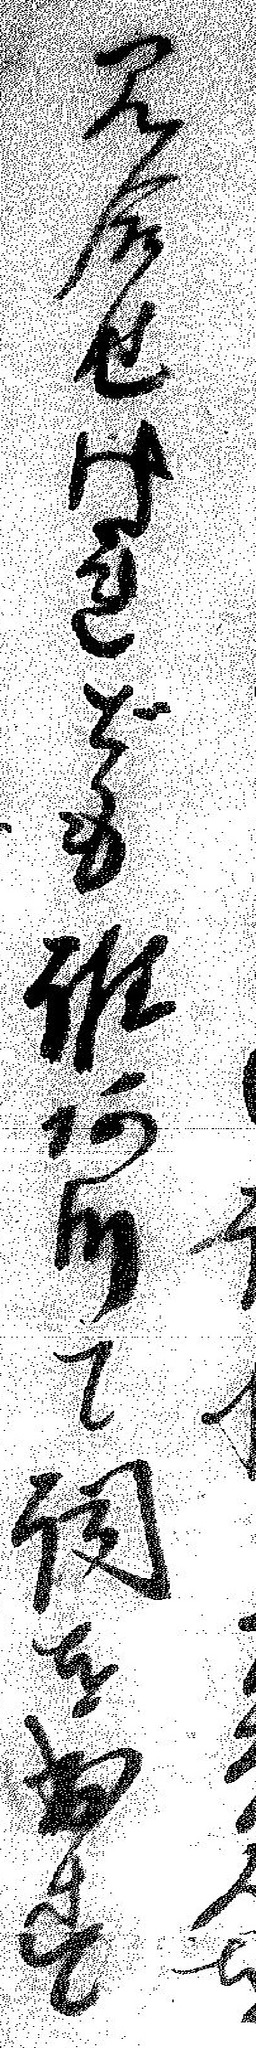見合せけれども誰あつて詞を出す
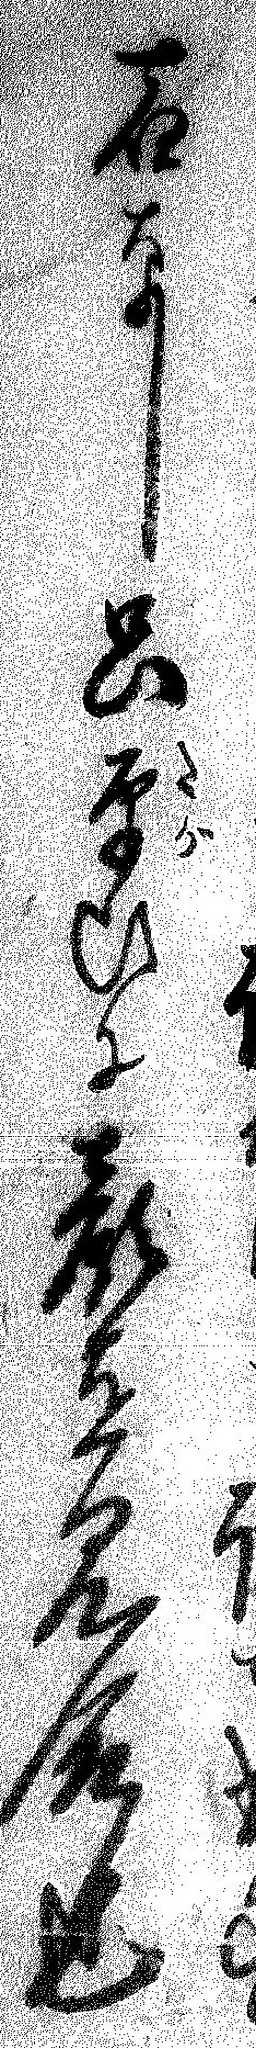者なし只互ひに顔を見合せ

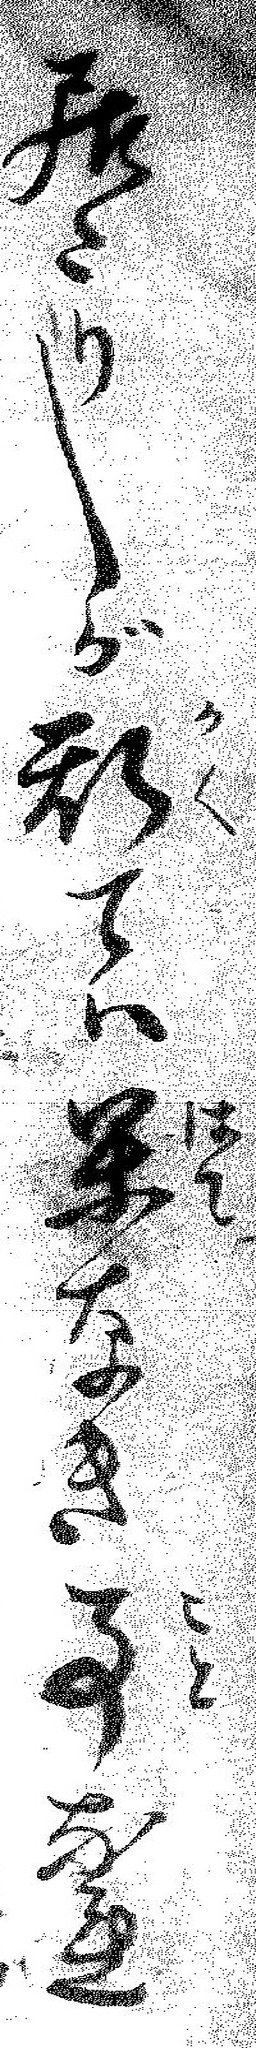居たりしが斯ては果なき事なれ
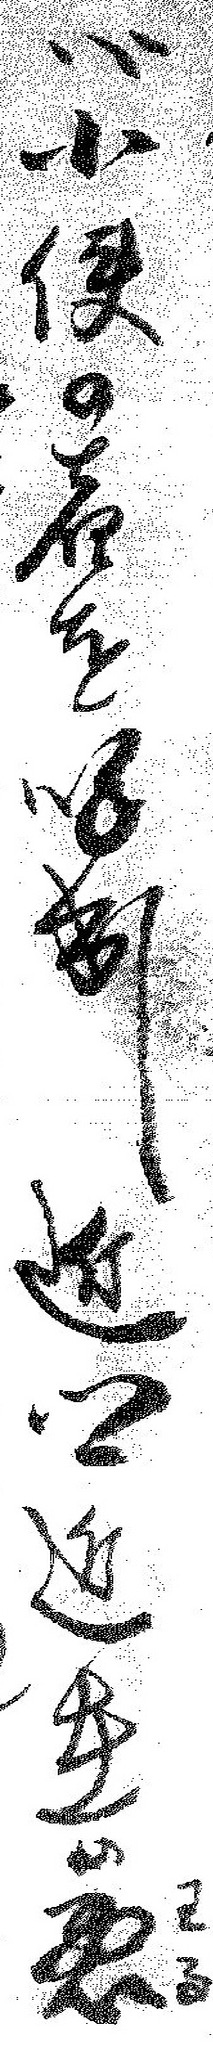ば小使の者を呼出し近郷近在の悪
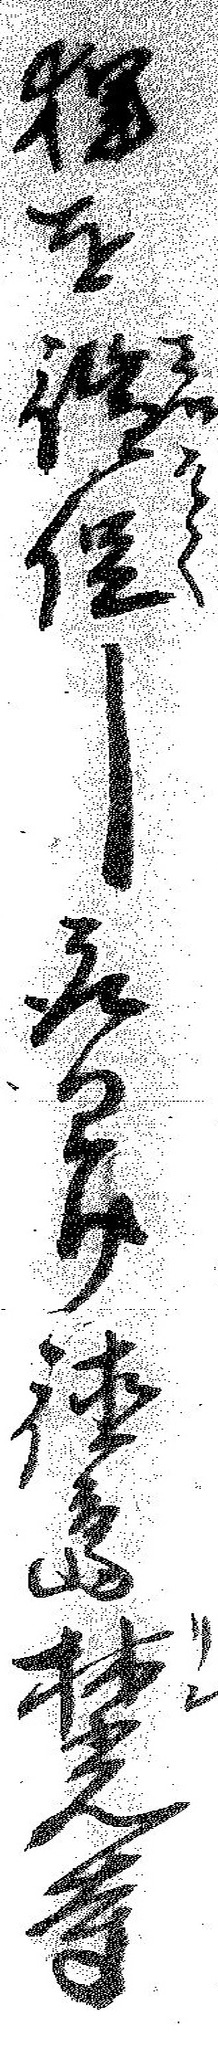狸を催促し取わけ徳島林光寺
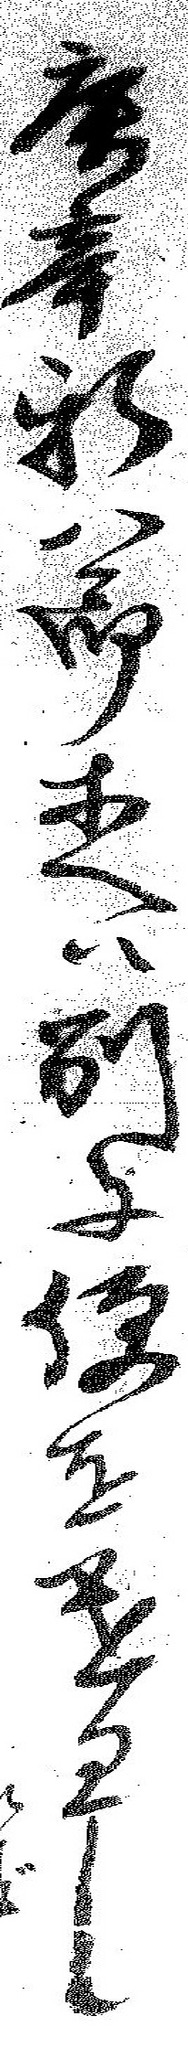庚辛新八郎等へは別に便を遣わし
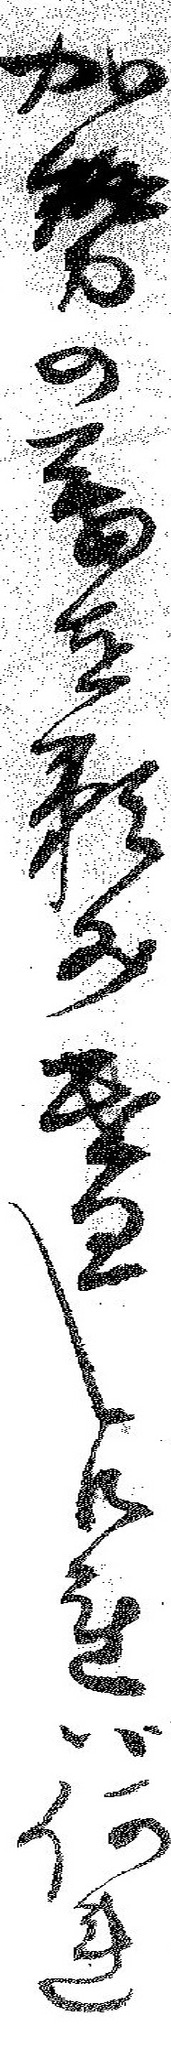加勢の義を頼み遣わしければ何れ
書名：近頃古狸珍説　礼義智信
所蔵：徳島県立図書館
